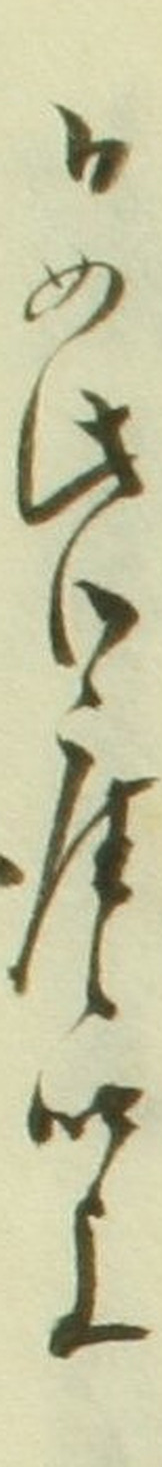日如此御座候以上
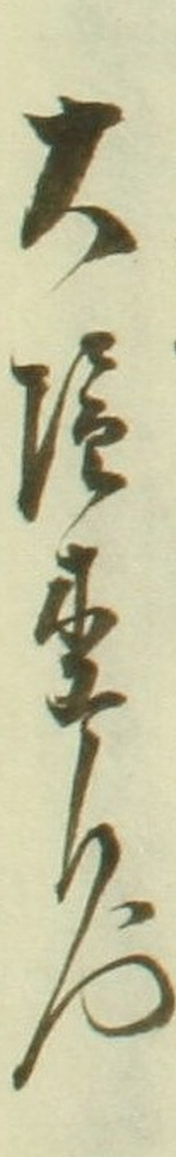大塩杢左衛門
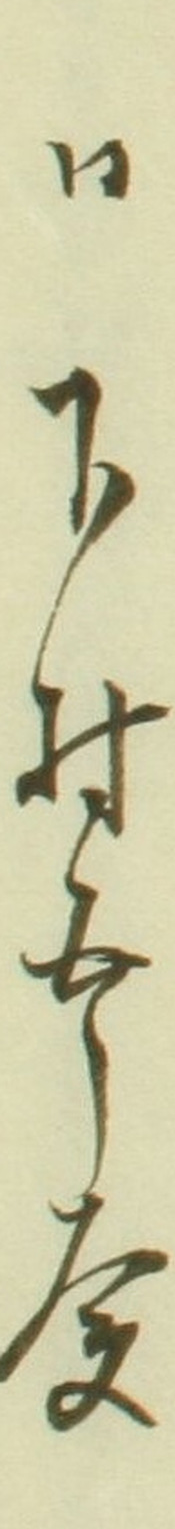同下村五郎太夫
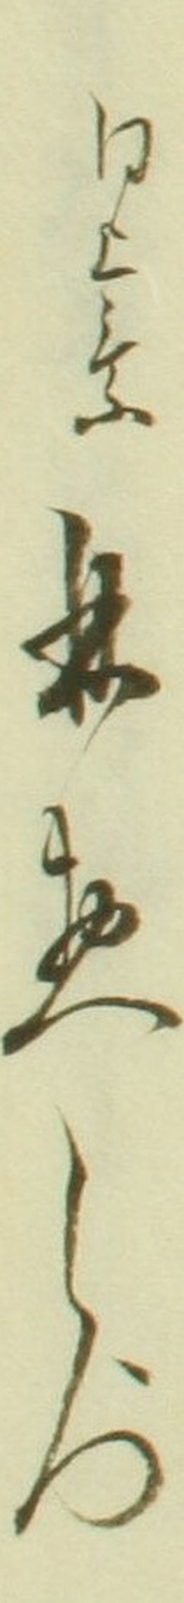同上乗林惣右衛門
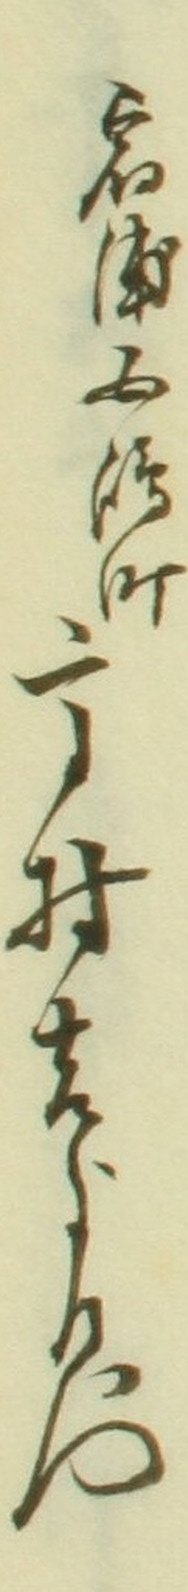宿浦五嶋町高村吉郎左衛門

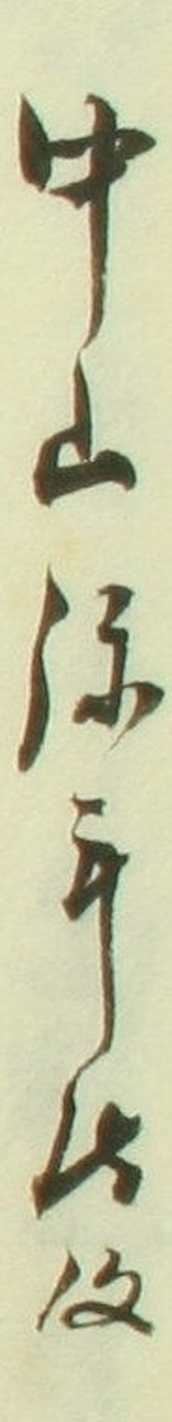中山弥平次殿
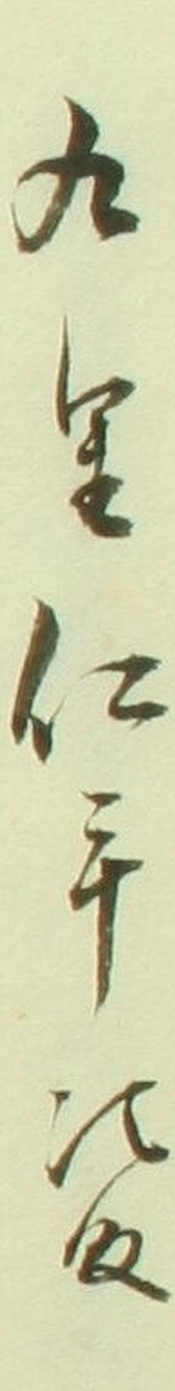九里仁平次殿
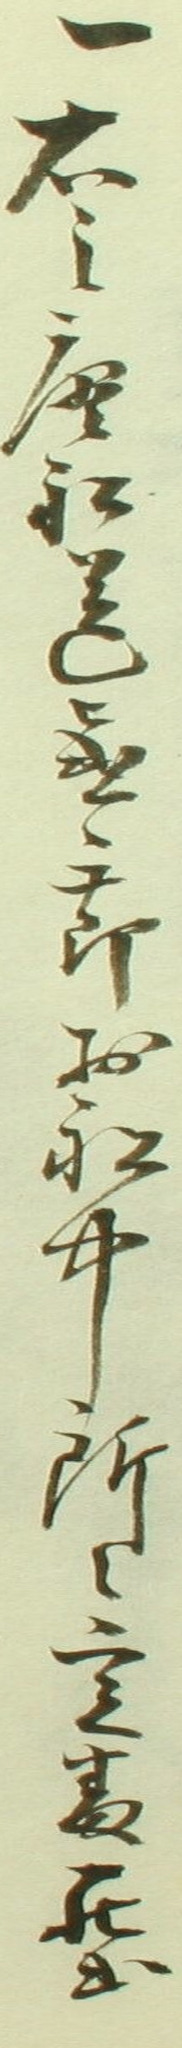一右之唐船送被遣候節於船中所々定番罷出
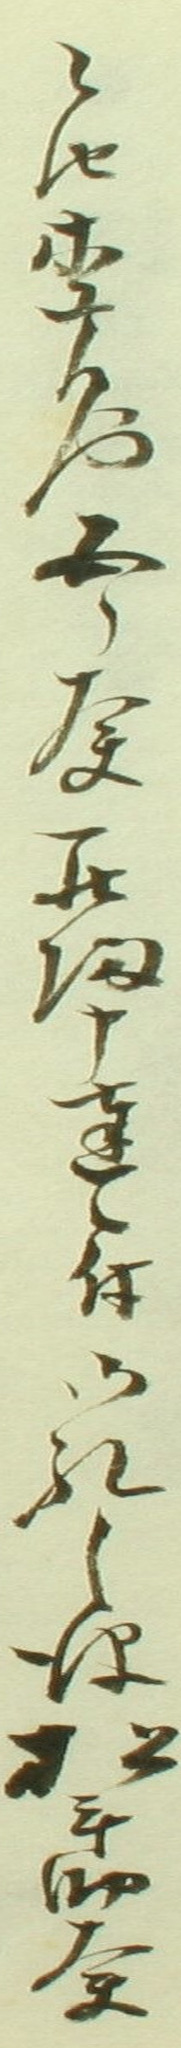候由杢左衛門五郎太夫罷帰申達候付御礼之儀松平助大夫
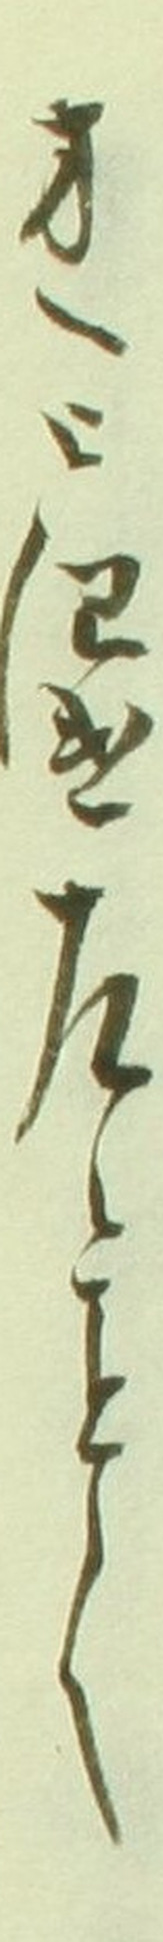方へ被仰遣左ことく
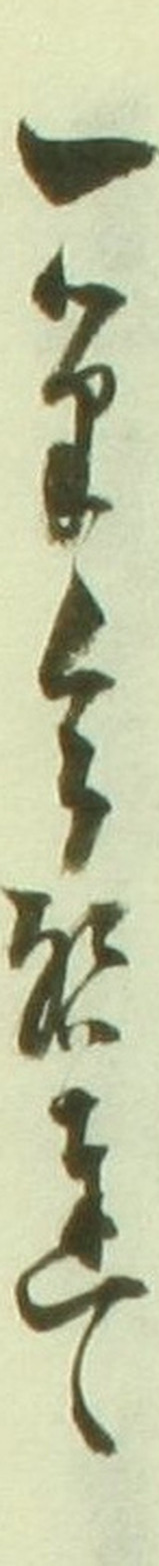一筆令啓達候
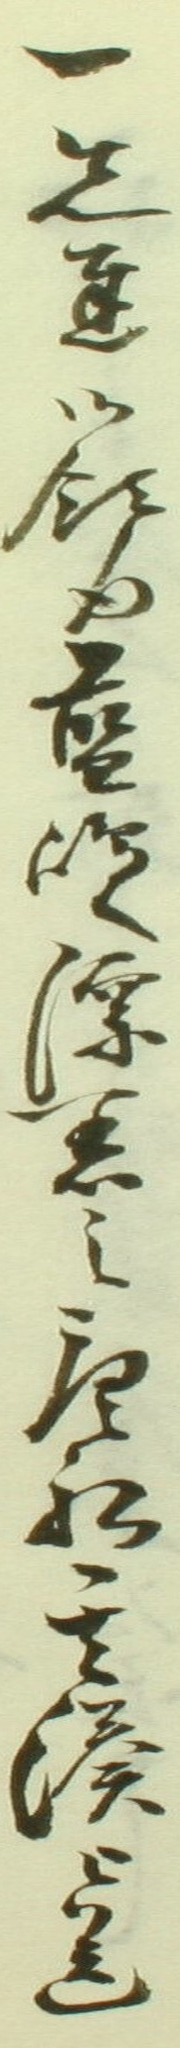一先達御領内藍嶋へ漂着之唐船其湊被送
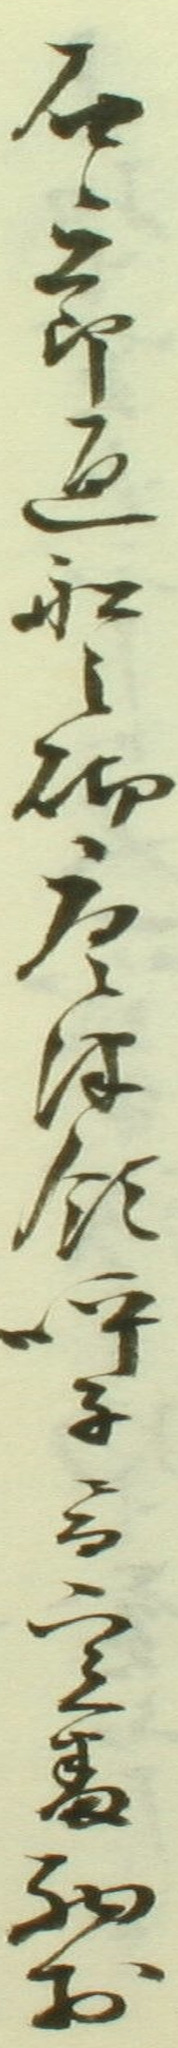届候節返船之砌唐津領呼子ニ而定番西お
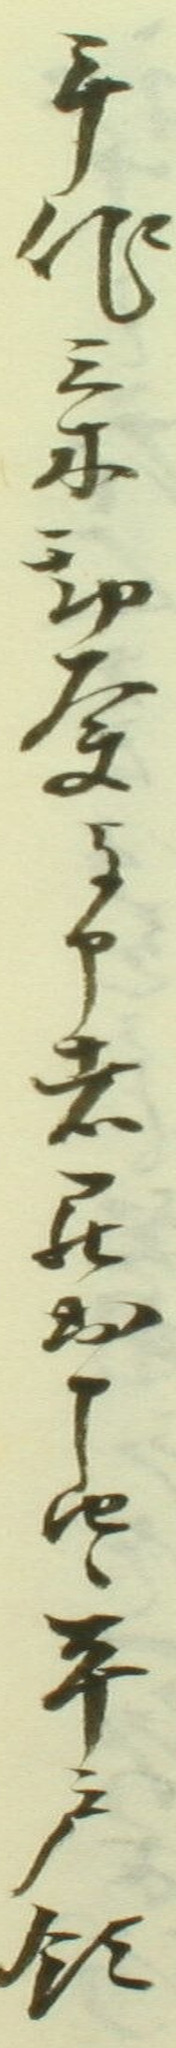平作三木勘太夫と申者罷出申由候平戸領
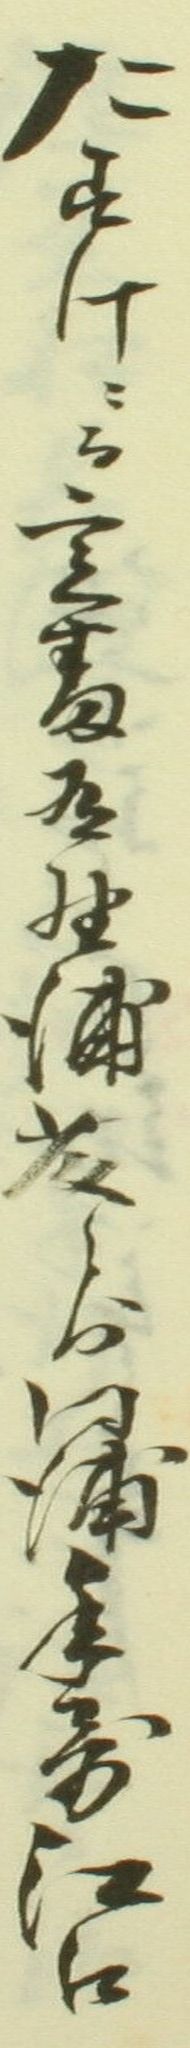たすけニ而定番有野浦藤右衛門同浦年寄江口
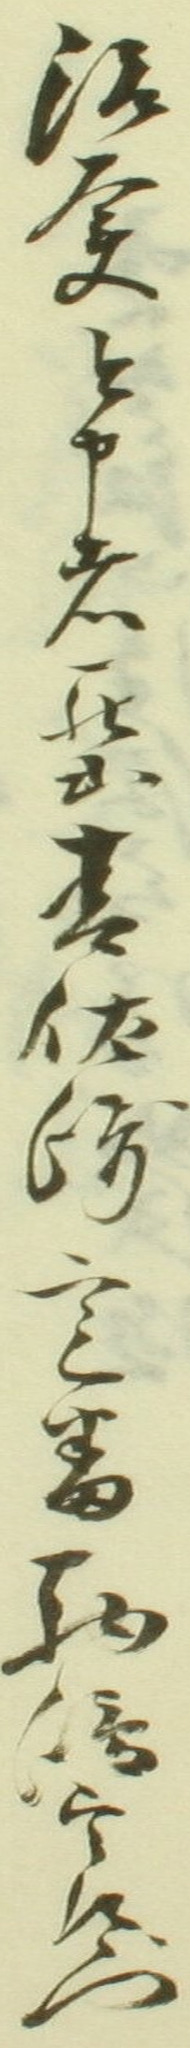治太夫と申者罷出青佐崎定番西嶋宇左衛門
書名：異国船漂着記
